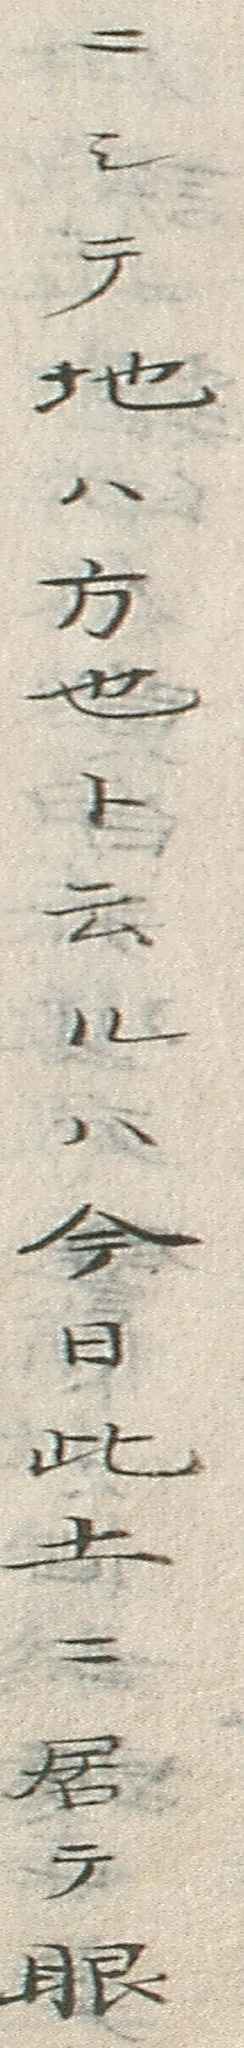ニシテ地ハ方也ト云ルハ今日此土ニ居テ眼
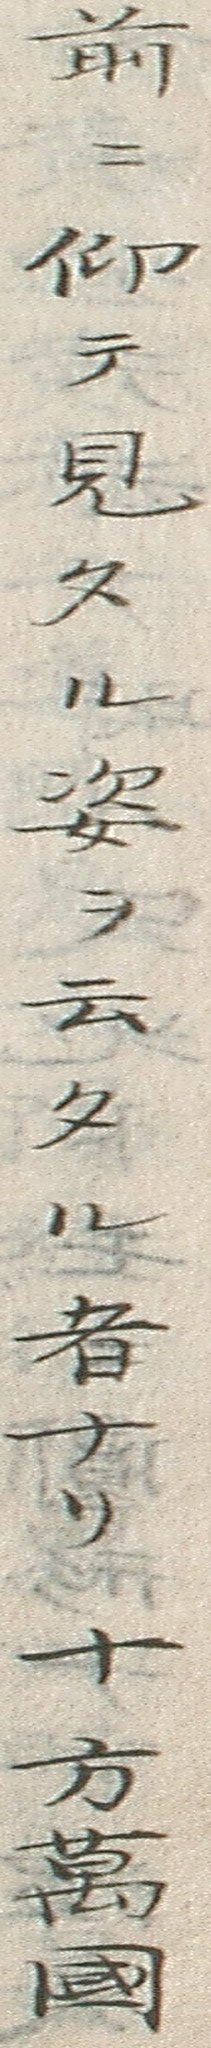前ニ仰テ見タル姿ヲ云タル者ナリ十方万国

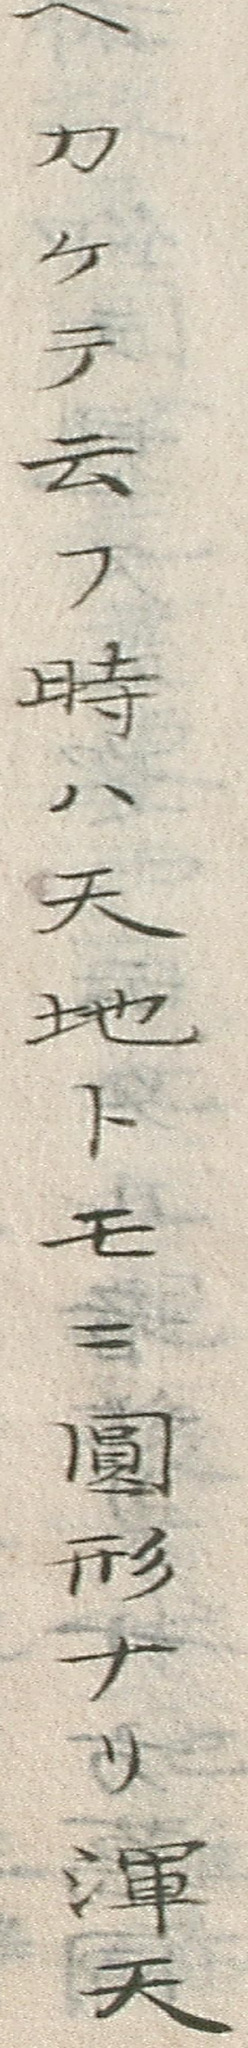ヘカケテ云フ時ハ天地トモニ円形ナリ渾天
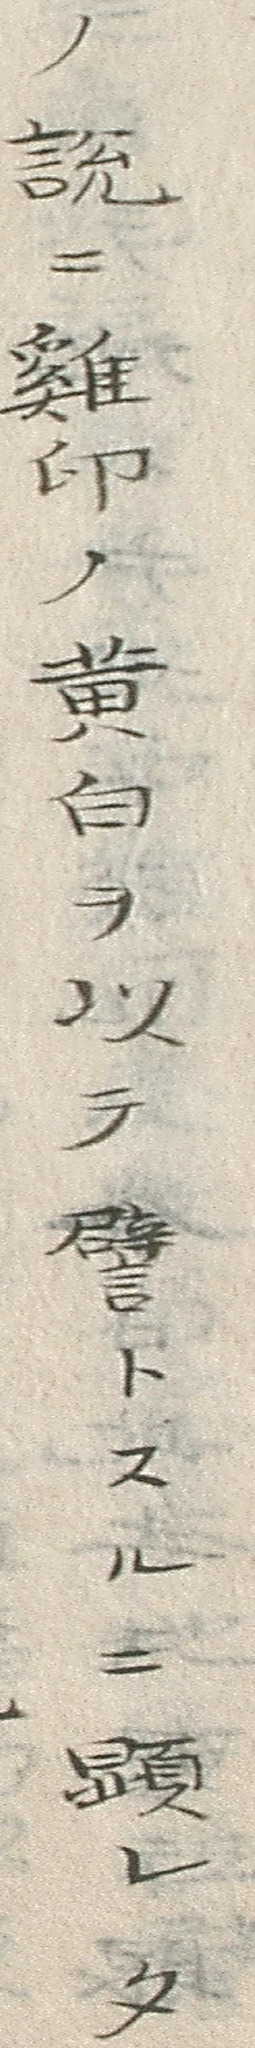ノ説ニ雞卵ノ黄白ヲ以テ譬トスルニ顕レタ
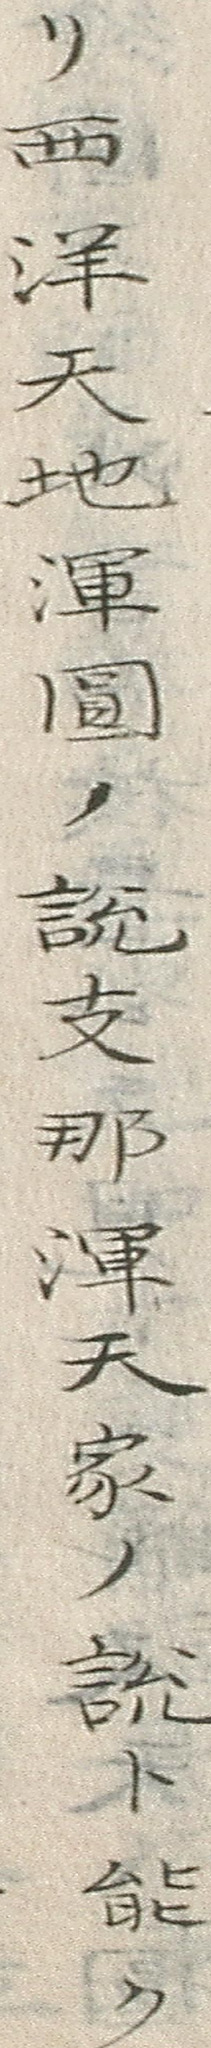リ西洋天地渾円ノ説支那渾天家ノ説ト能ク
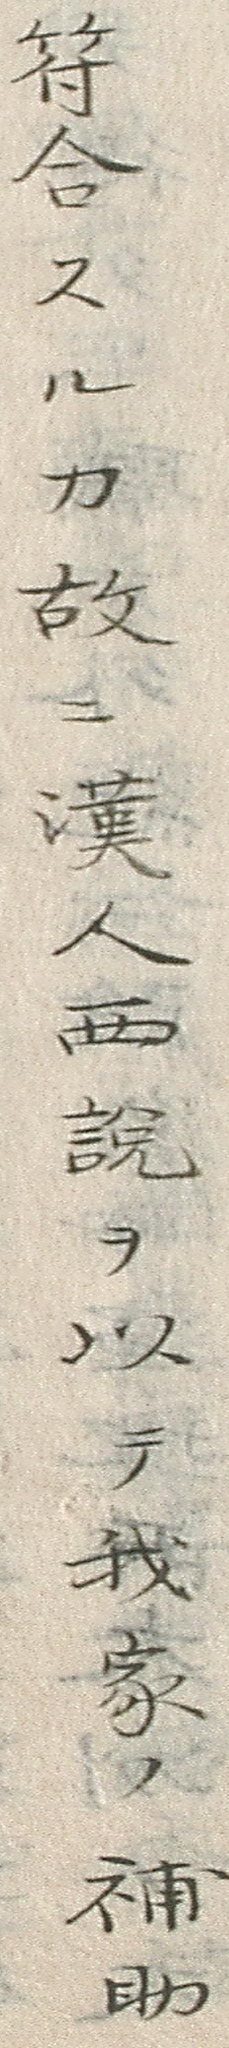符合スルカ故ニ漢人西説ヲ以テ我家ノ補助
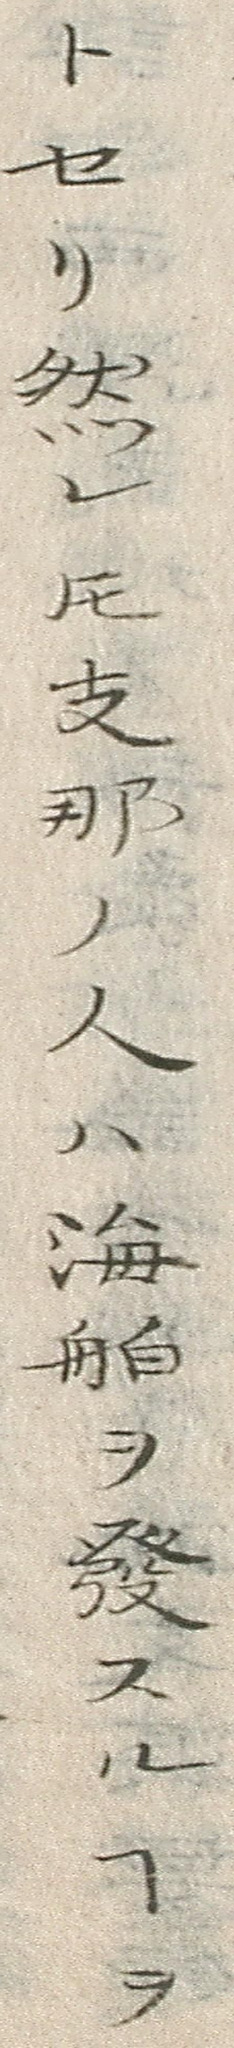トセリ然レトモ支那ノ人ハ海舶ヲ発スルコトヲ
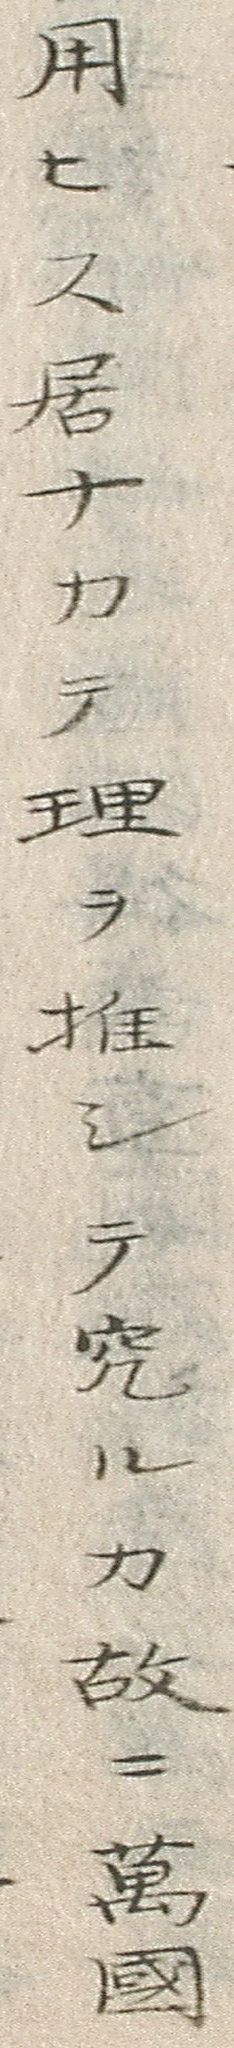用ヒス居ナカテ理ヲ推シテ究ルカ故ニ万国
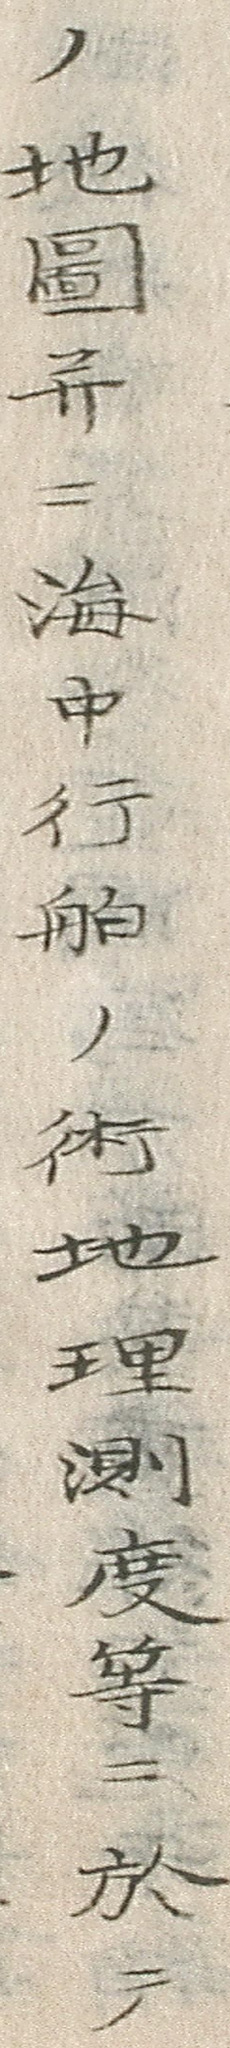ノ地図并ニ海中行舶ノ術地理測度等ニ於テ
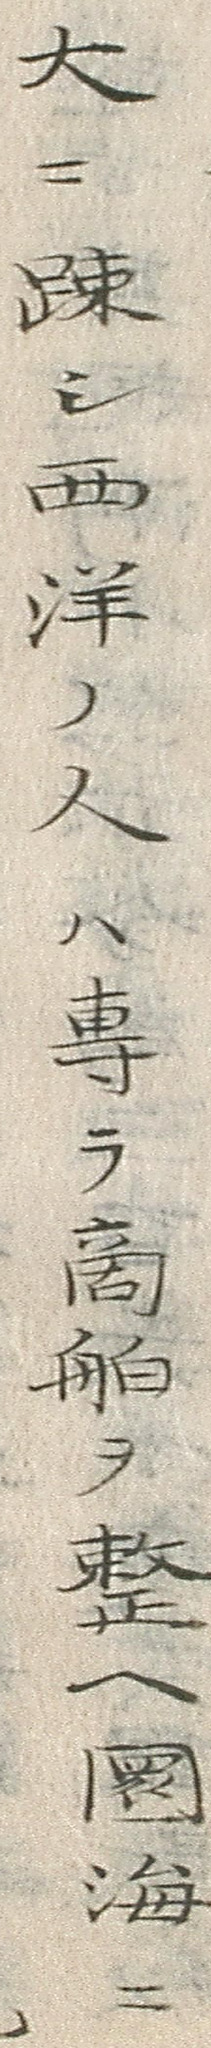大ニ疎シ西洋ノ人ハ専ラ商舶ヲ整ヘ圜海ニ
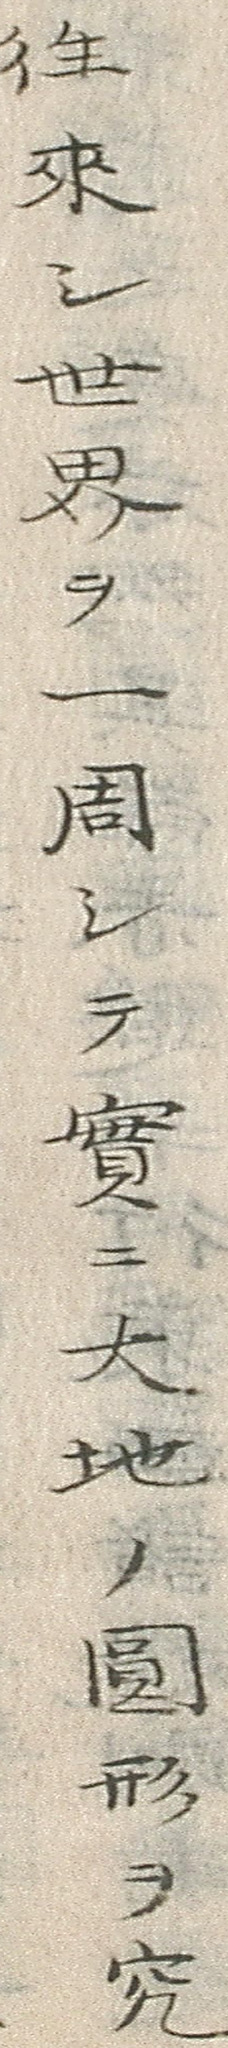往来シ世界ヲ一周シテ実ニ大地ノ円形ヲ究
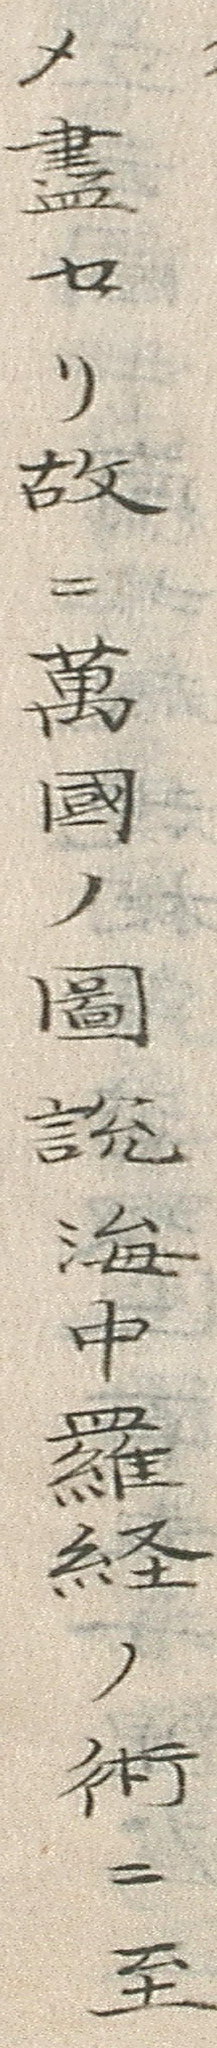メ尽セリ故ニ万国ノ図説海中羅経ノ術ニ至
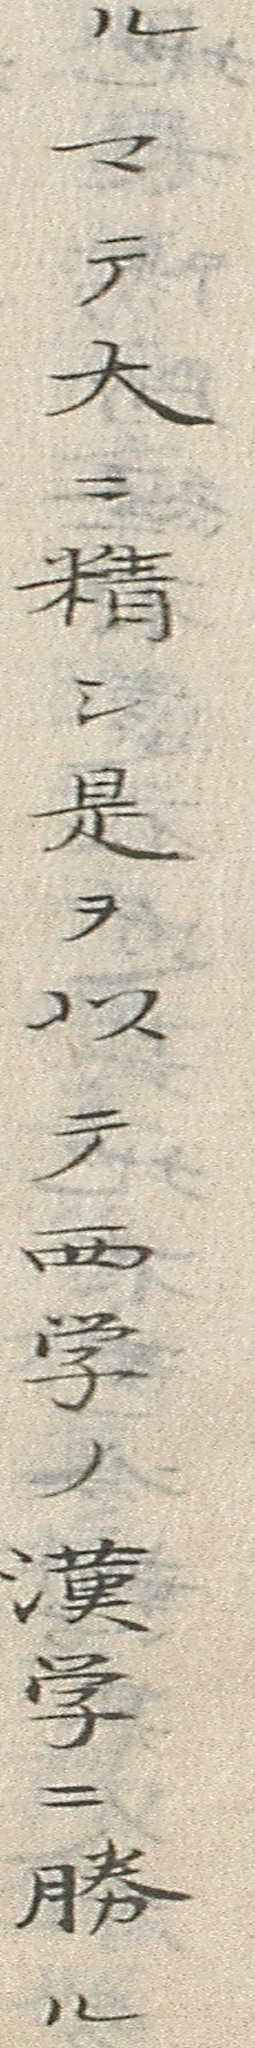ルマテ大ニ精シ是ヲ以テ西学ノ漢学ニ勝ル
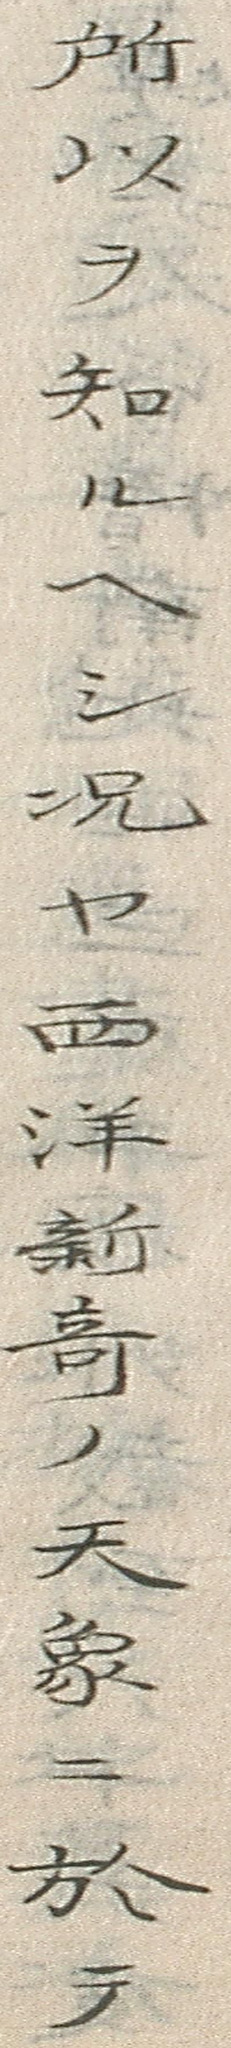所以ヲ知ルヘシ況ヤ西洋新奇ノ天象ニ於テ
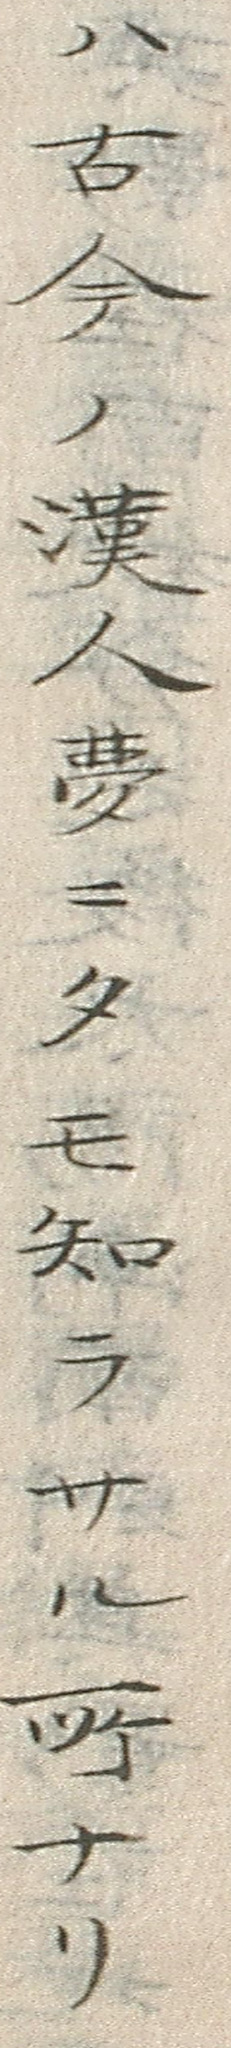ハ古今ノ漢人夢ニタモ知ラサル所ナリ
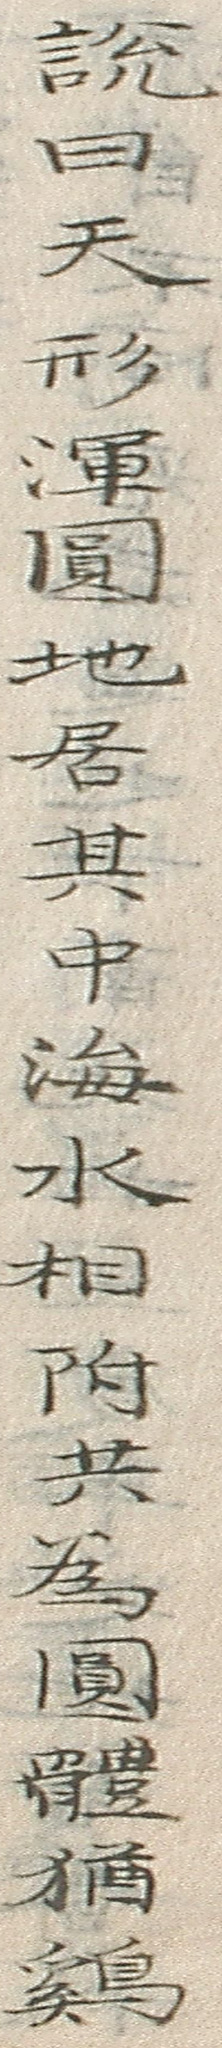説曰天形渾円地居其中海水相附共為円体猶鷄
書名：天學略名目羽翼　全
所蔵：東京大学地震研究所図書室 Earthquake Research Institute Library, The University of Tokyo, JAPAN
